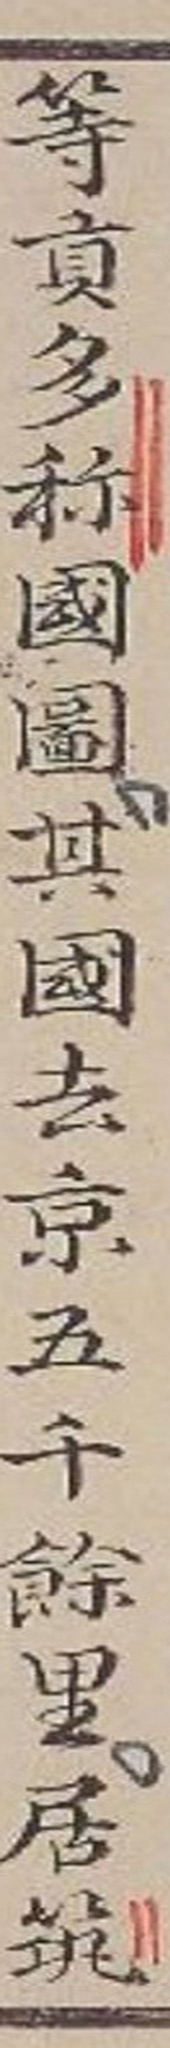等貢多称国図。其國去京五千余里。居筑
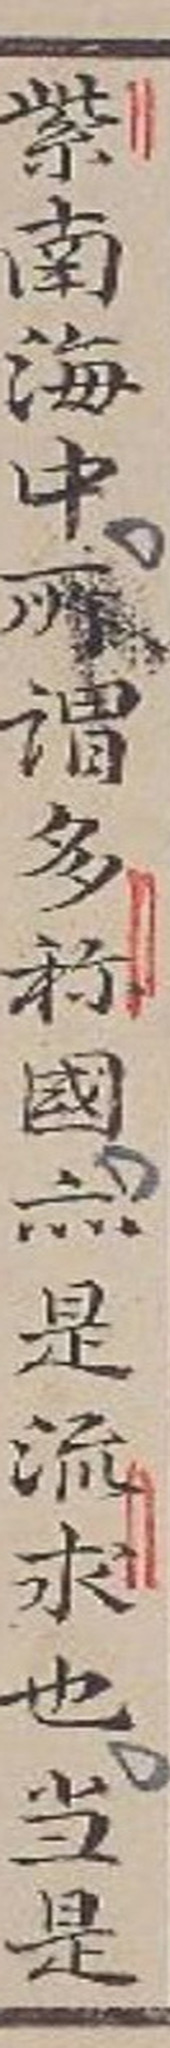紫南海中。所謂多称国。亦是流求也。当是
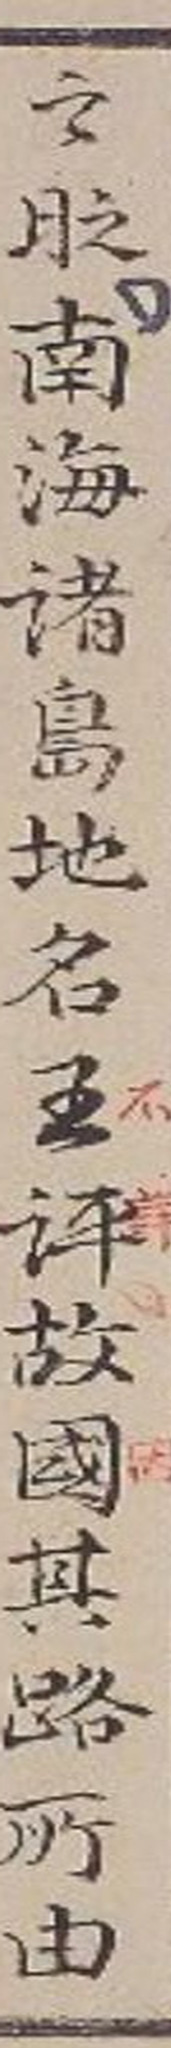之時。南海諸島地名王評不詳。故国因其路所由
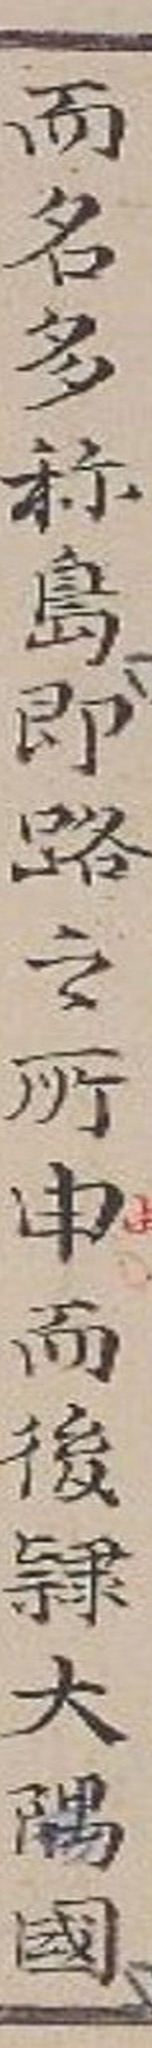而名多称島。即路之所申由。而後隷大隅国。
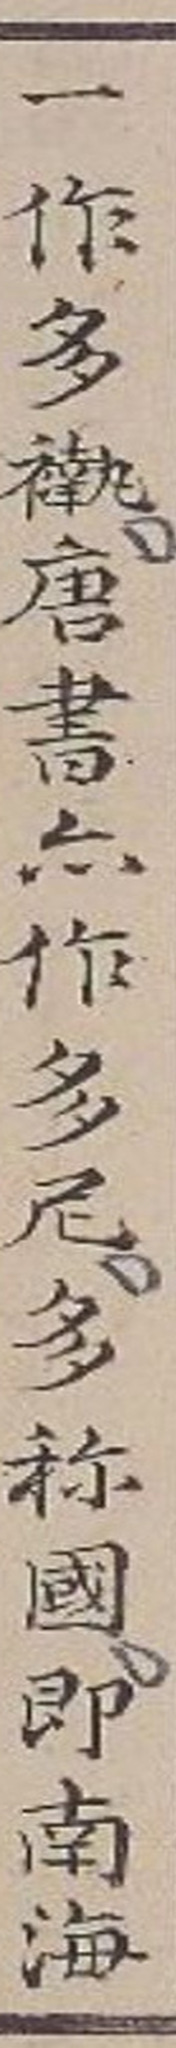一作多褹。唐書亦作多尼。多称国。即南海
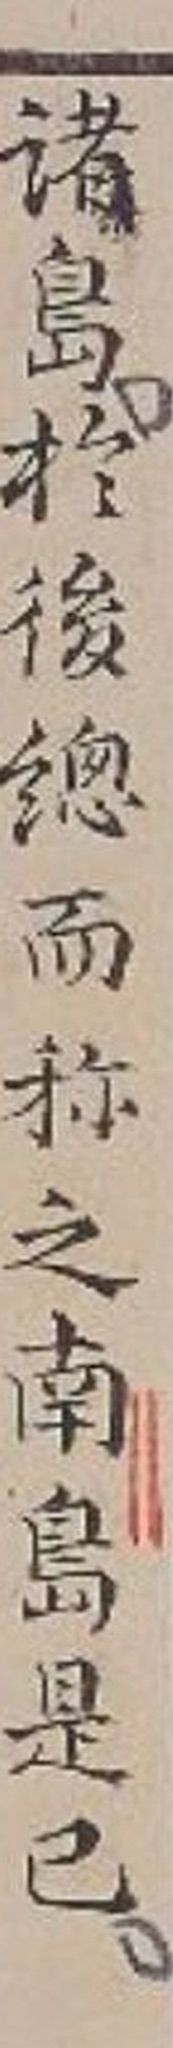諸島。於後総而称之南島是已。
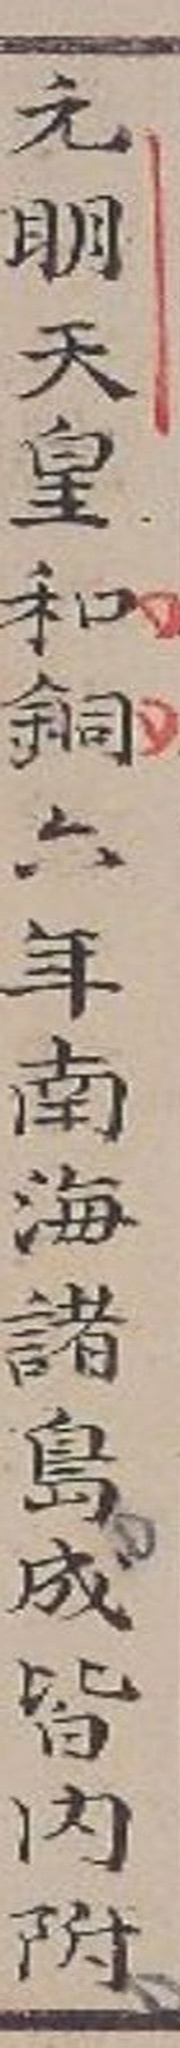元眀天皇和銅六年南海諸島。成皆内附。

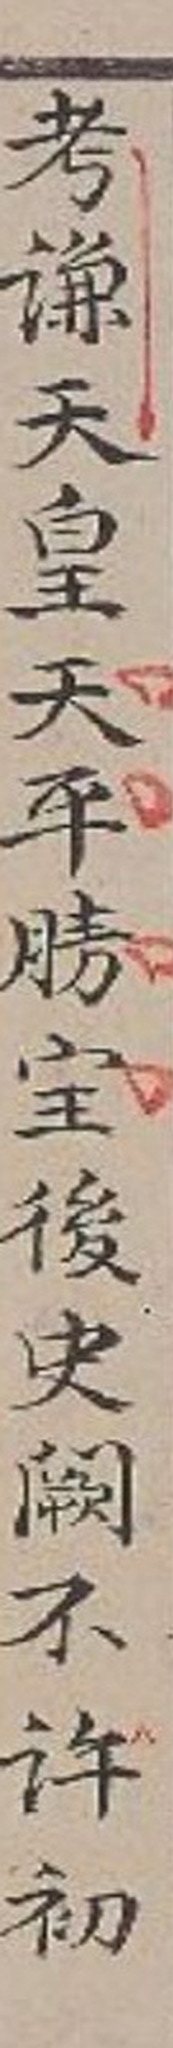孝謙天皇天平勝宝後史闕不許初
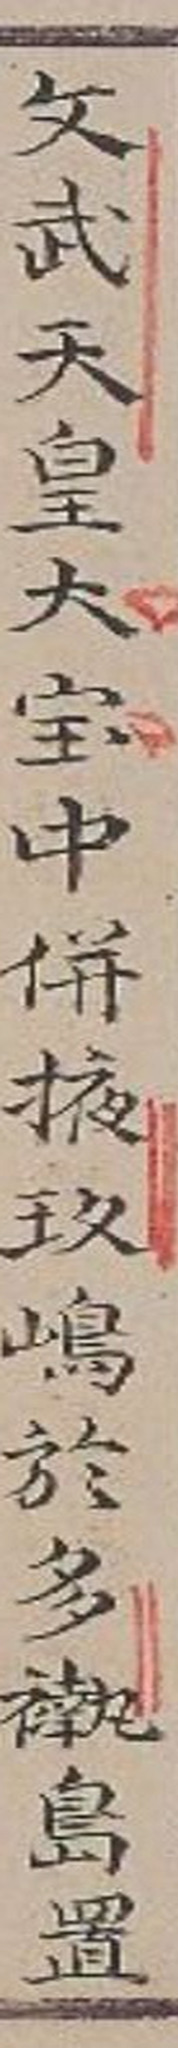文武天皇大宝中併掖玖島於多褹島置
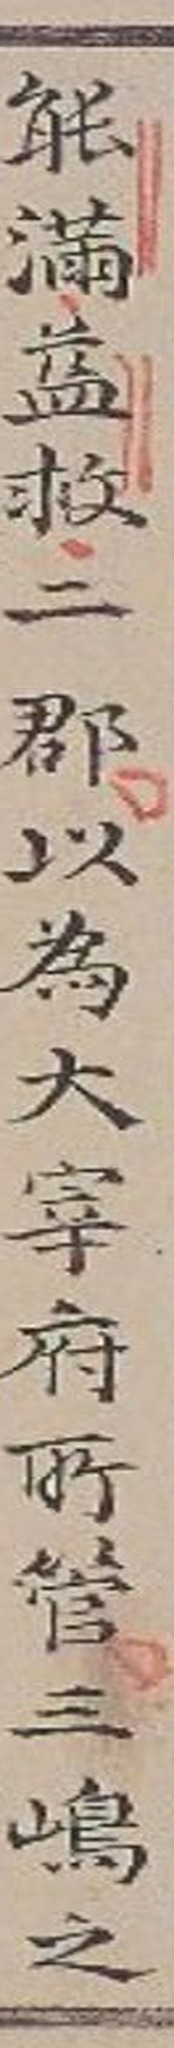能満。益救。二郡。以為大宰府所管。三島之
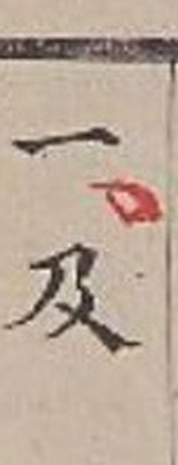一。及
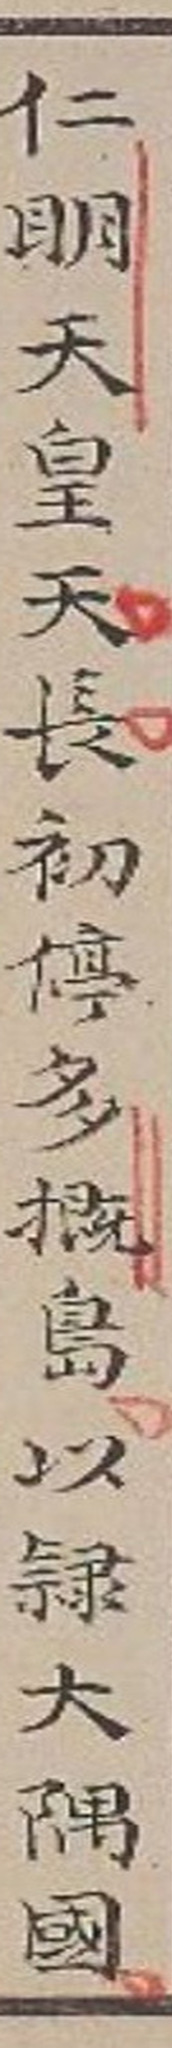仁眀天皇天長初停多概島。以隷大隅国。
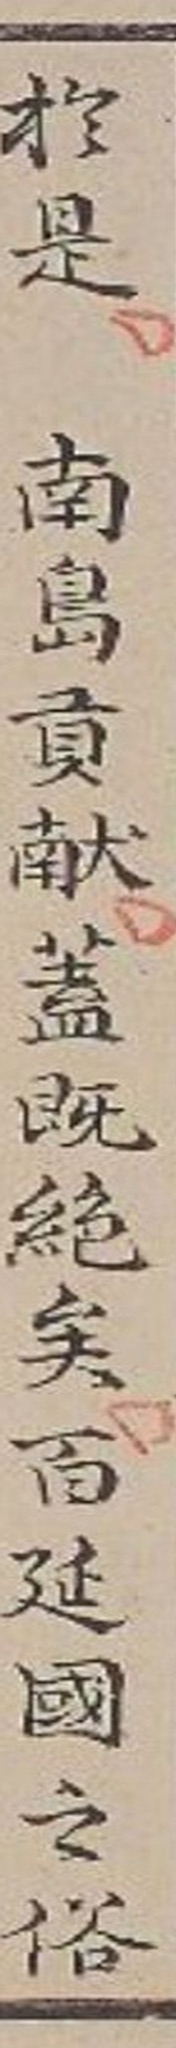於是。南島貢献。蓋既絶矣。百延国之俗
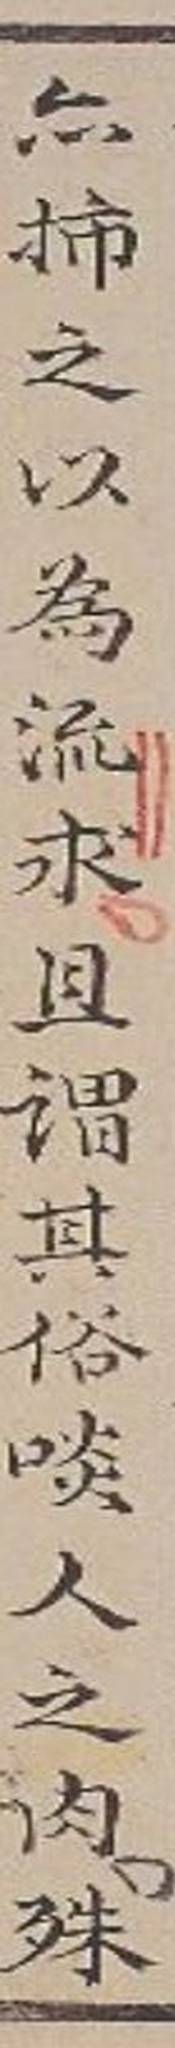亦㧊之以為流求。且謂其俗啖人之肉。殊
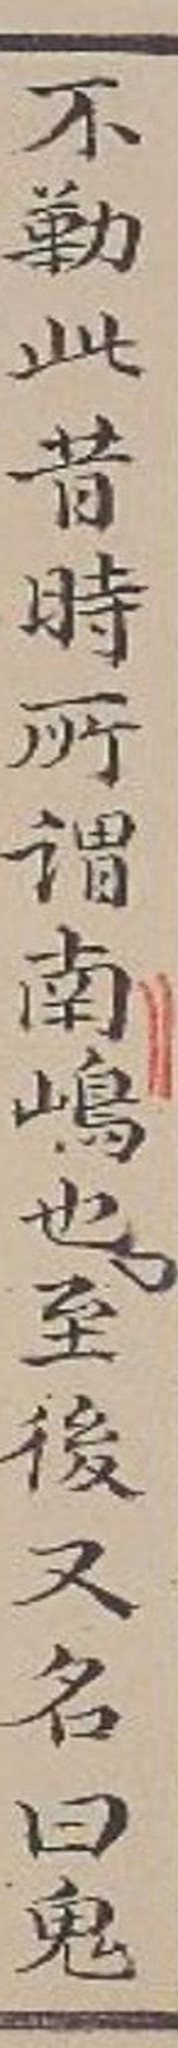不勤此昔時所謂南島也。至後又名曰鬼
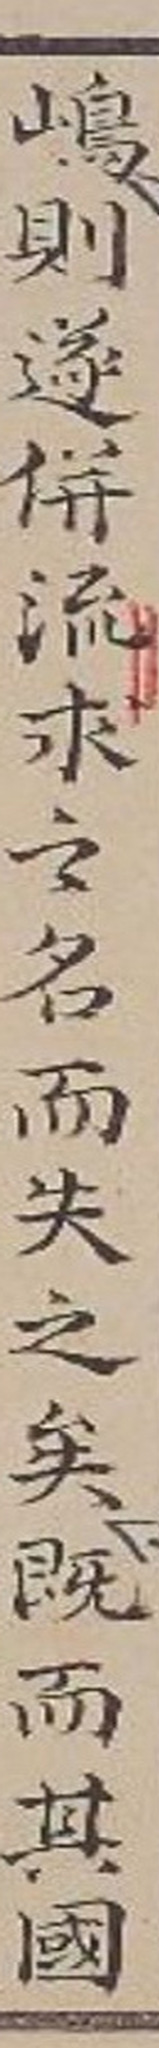島。則遂併流求之名而失之矣。既而其国
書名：南島志 全
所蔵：University of the Ryukyus Library
